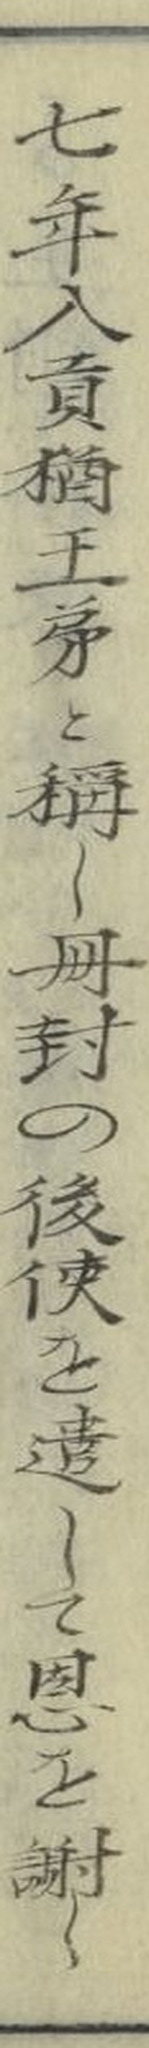七年入貢猶王弟と称し冊封の後使を遣して恩を謝し
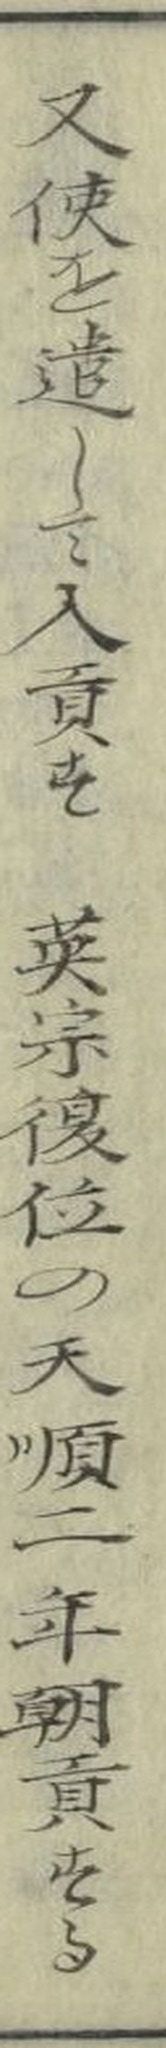又使を遣して入貢す英宗復位の天順二年朝貢する
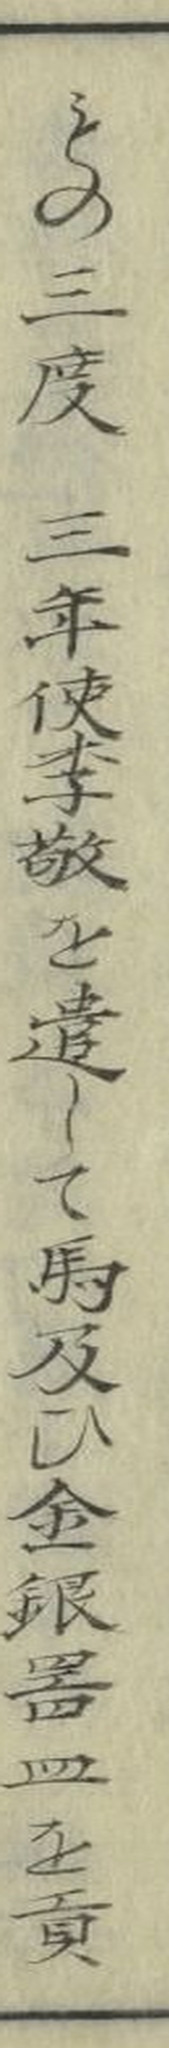もの三度三年使李敬を遣して馬及ひ金銀器皿を貢
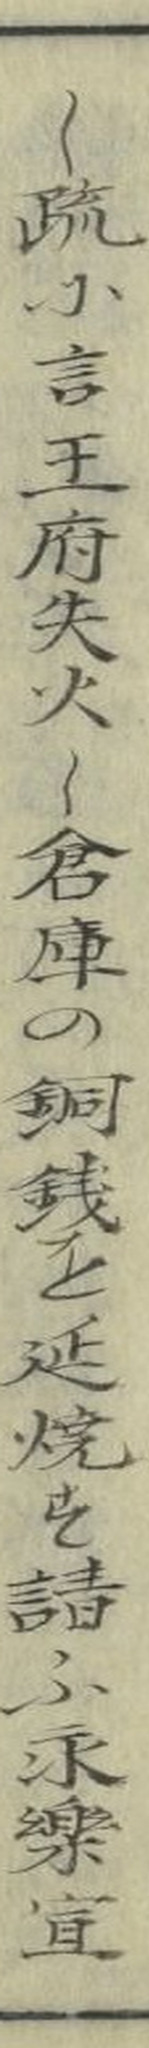し疏に言王府失火し倉庫の銅銭を延焼す請ふ永楽宣

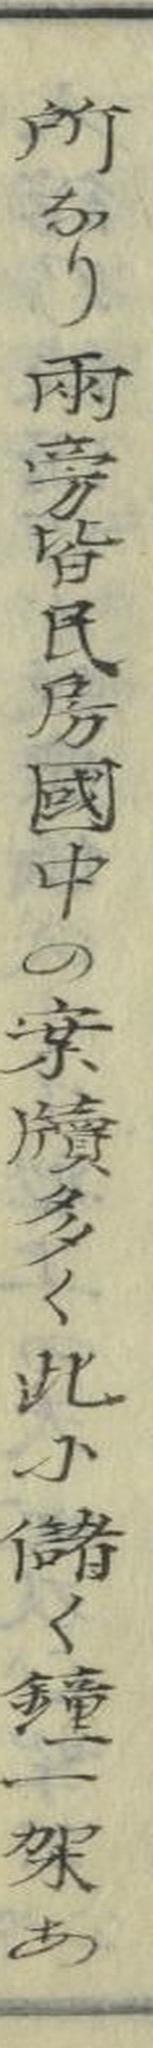所なり雨旁皆民房国中の案牘多く此に儲く鐘一架あ
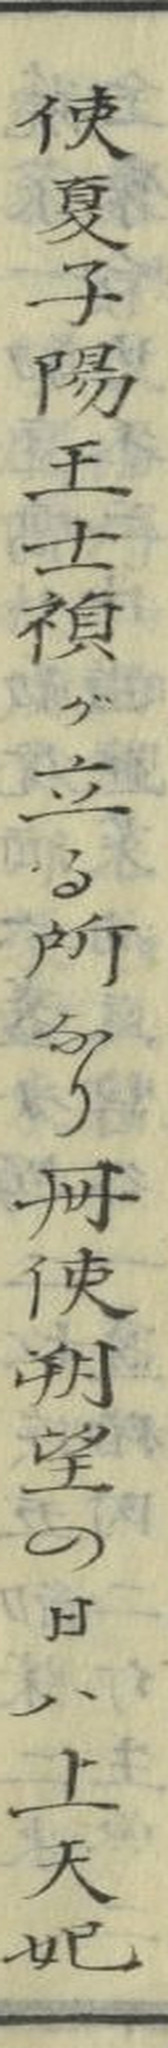使夏子陽王士禎が立る所なり冊使朔望の日は上天妃
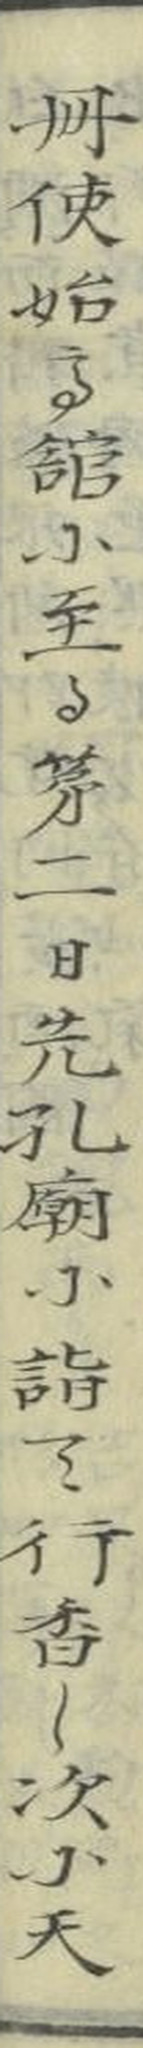冊使始て館に至る第二日先孔廟に詣て行香し次に天
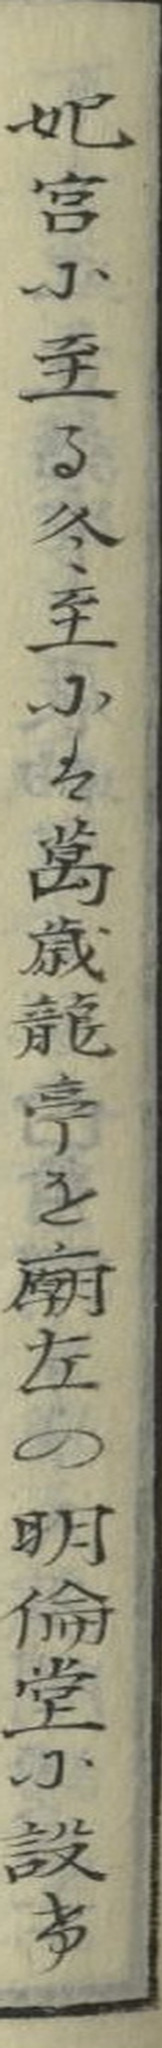妃宮に至る冬至には万歳龍亭を廟左の明倫堂に設け
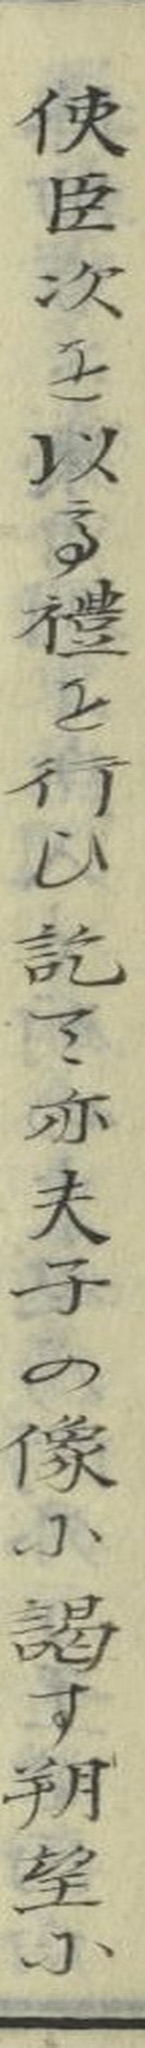使臣次を以て礼を行ひ訖て亦夫子の像に謁す朔望に
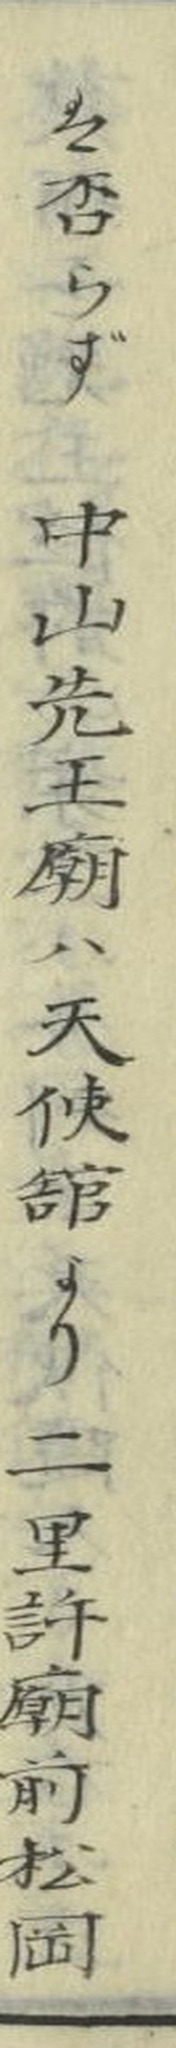は否らず中山先王廟は天使館より二里許廟前松岡
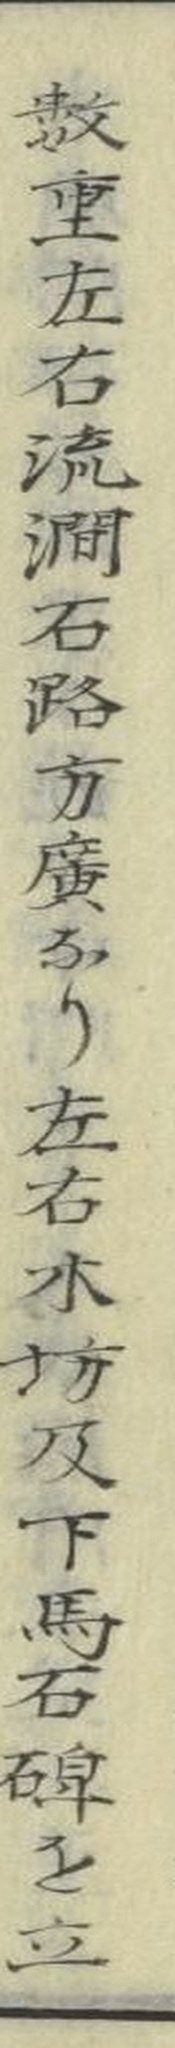数重左右流澗石路方広なり左右木坊及下馬石碑を立
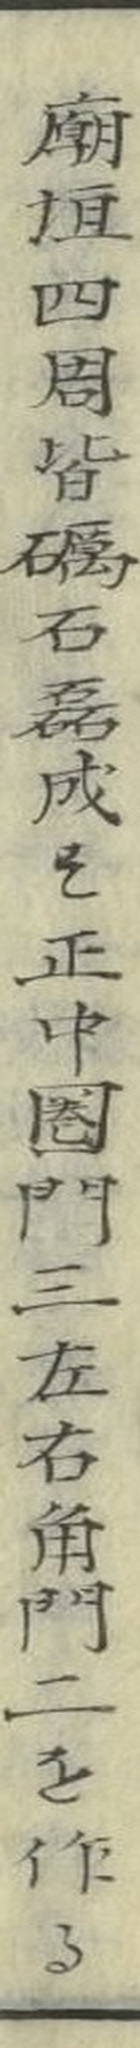廟垣四周皆蠣石磊成す正中圏門三左右角門二を作る
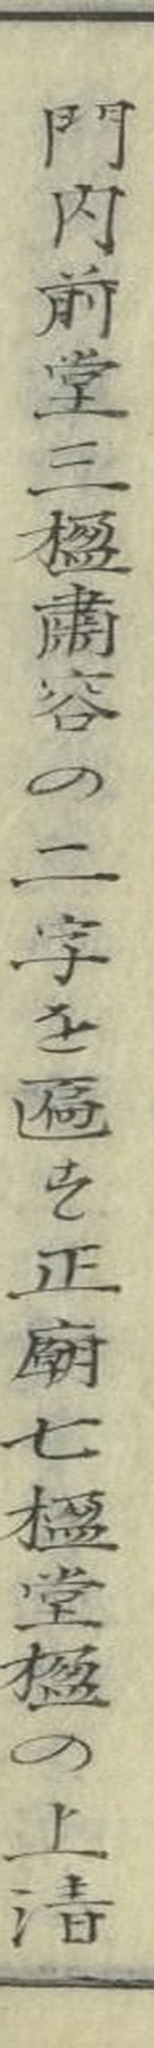門内前堂三楹肅容の二字を匾す正廟七楹堂楹の上清
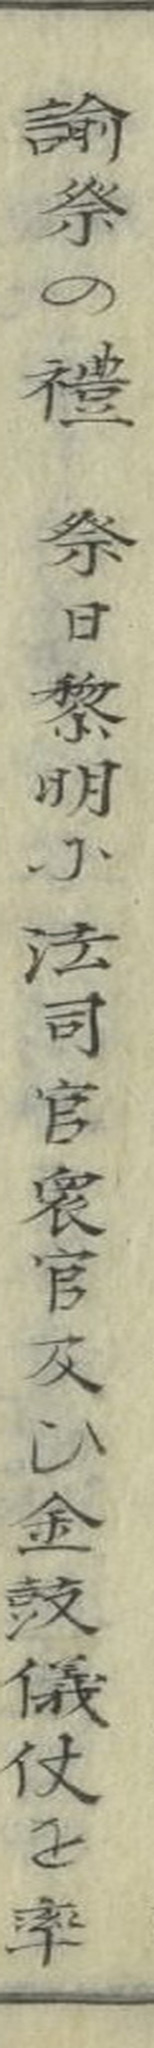諭祭の礼祭日黎明に法司官衆官及ひ金鼓儀仗を率
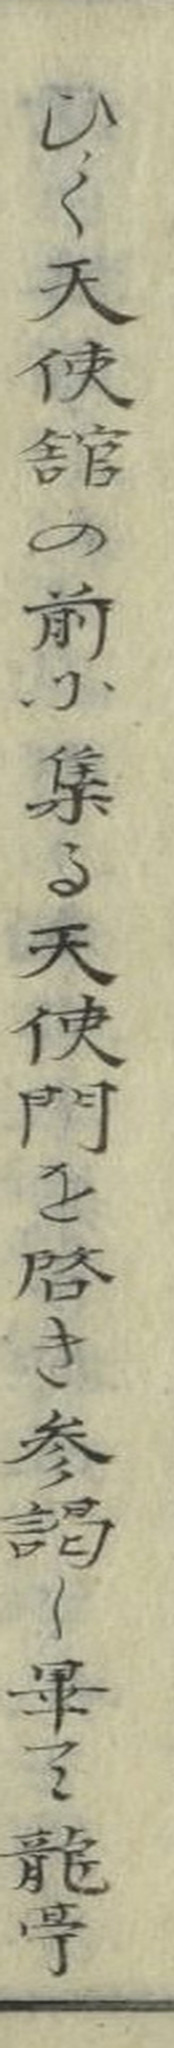ひて天使館の前に集る天使門を啓き参謁し畢て龍亭
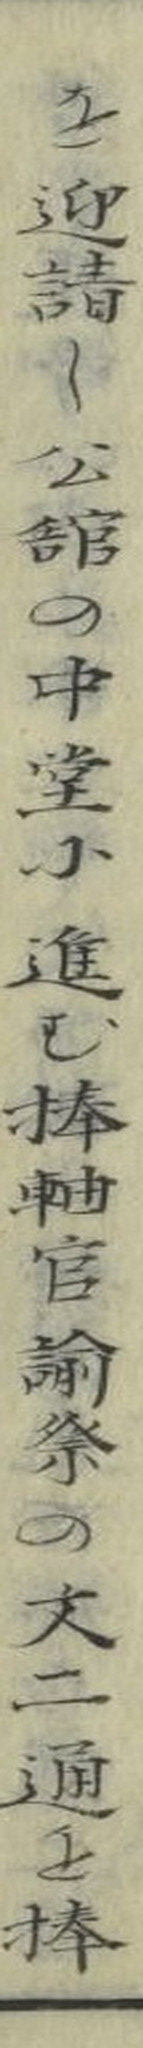を迎請し公館の中堂に進む捧軸官諭祭の文二通を捧
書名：琉球沿革志 下
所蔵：University of the Ryukyus Library
